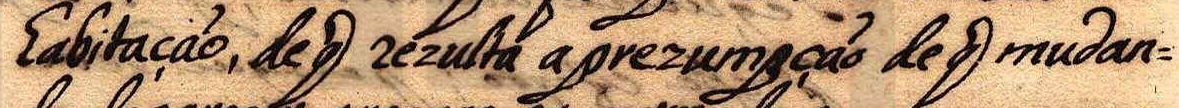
habitaçaõ, de q̄ rezulta a prezumpçaõ de q̄ mudan
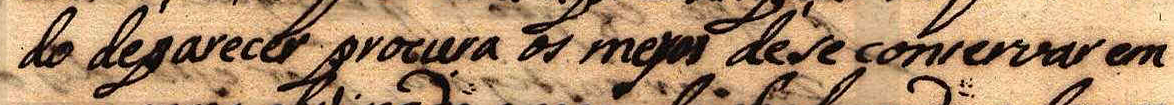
do de parecer procura os meyos de se conservar em
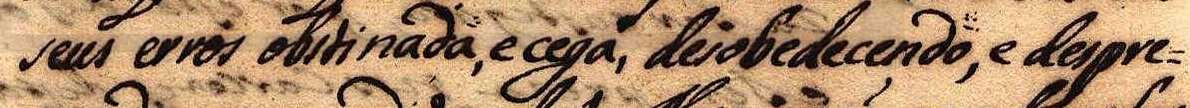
seus erros obstinada, e cega, desobedecendo, e despre
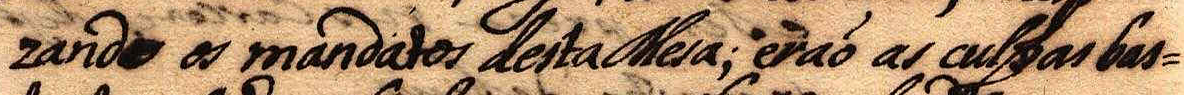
zando os mandatos desta Mesa; eraõ as culpas bas
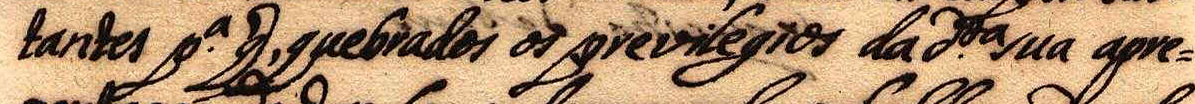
tantes p.a q̄, quebrados os previlegios da d.ta sua apre
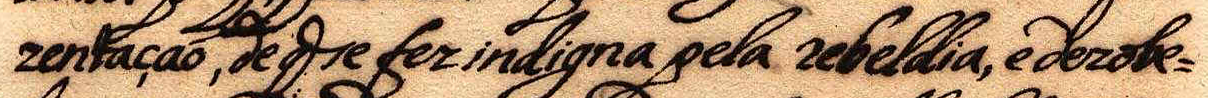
zentação, de q̄ se fez indigna pela rebeldia, e dezobe
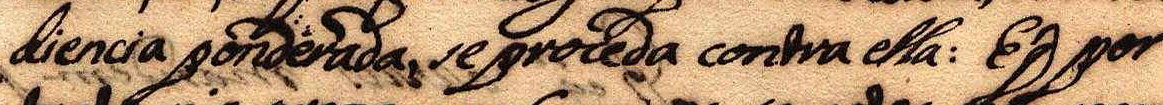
diencia ponderada, se proceda contra ella: E q̄ por
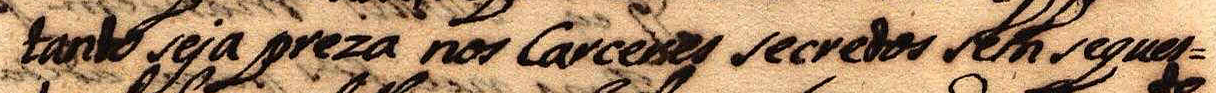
tanto seja preza nos Carceres secretos sem seques
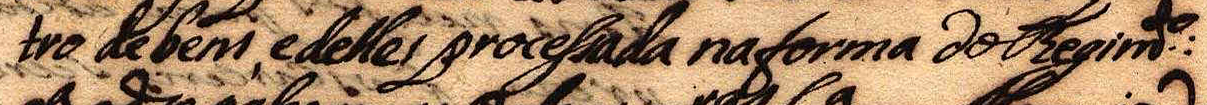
tro de bens, e delles processada na forma do Regim.to:
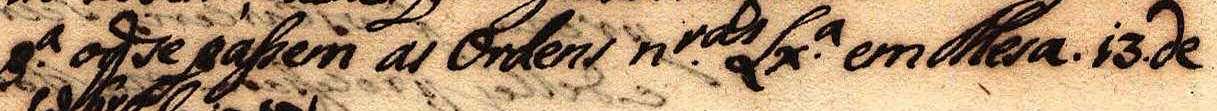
p.a o q̄ se passem as Ordens n.ras Lx.a em Mesa. i3. de
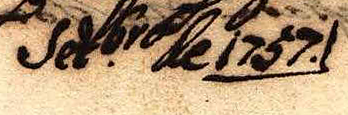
Set.bro de i757. /
